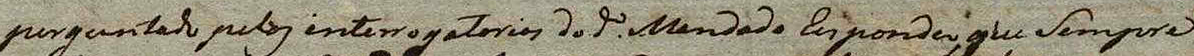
perguntado pelos interrogatorios do d.o Mandado Respondeo, que sempre
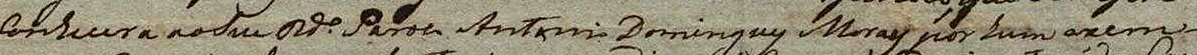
Conhecera ao Seu Rd.o Paroco Antonio Domingues Moraes por hum exem
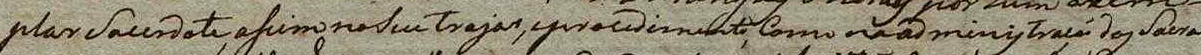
plar Sacerdote assim no Seu trajar, e procedimento, Como na administração dos Sacra
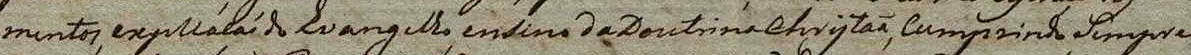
mentos, explecaçaõ do Evangelho, ensino da Doutrina Christaã, Cumprindo sempre
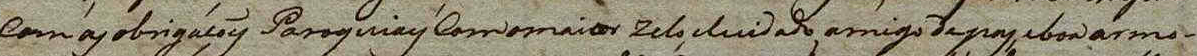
Com as obrigações Paroquiaes Com o maior zelo, e cuidado, amigo da paz e boa armo
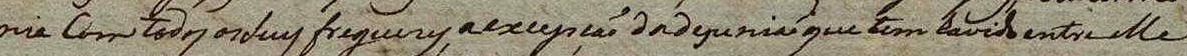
nia Com todos os seus freguezes, a excepçaõ da desuniaõ que tem havido entre elle
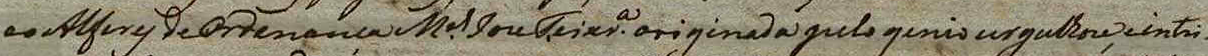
e o Alferes de Ordenança M.el Ioze Teixr.a originada pelo genio urgulhozo, e intri
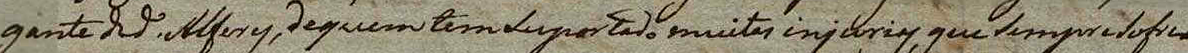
gante do d.o Alferes, de quem tem suportado muitas injurias, que sempre sofreo
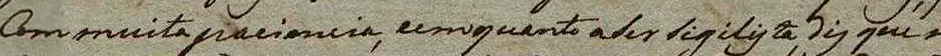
Com muita paciencia, e emquanto a ser sigilista, dis que
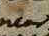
naõ
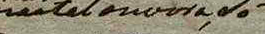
nao tal ouvira so
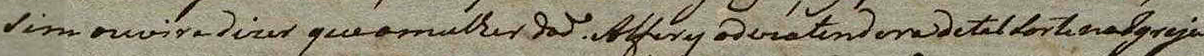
sim ouvira dizer que a mulher do d.o Alferes o dezatendera de tal sorte na Igreja
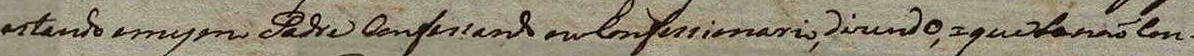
estando o mesmo Padre Confessando ao Confessionario, dizendo, = que senaõ con
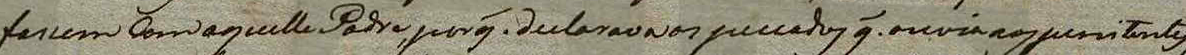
fessem Com aquelle Padre, porq̄ declarava os peccados q̄ ouvia aos penitentes,
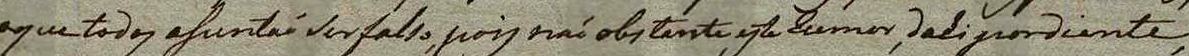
o que todos assentaõ ser falso, pois naõ obstante este Rumor, dahi por diante,
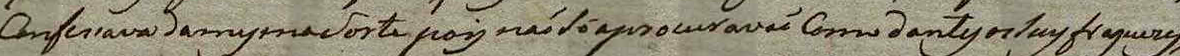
Confessava da mesma sorte pois naõ só aprocuravaõ Como dantes os seus freguezes,
